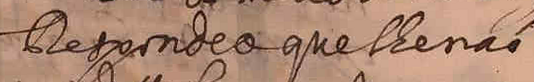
Respondeo que lhe naõ
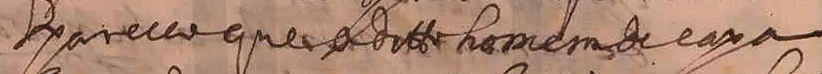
pareceo que o ditto homem de capa
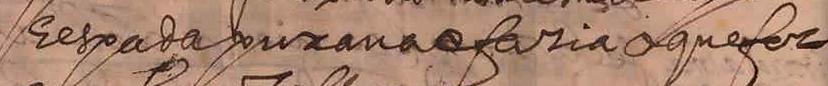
E espada puxaua e fazia o que fez
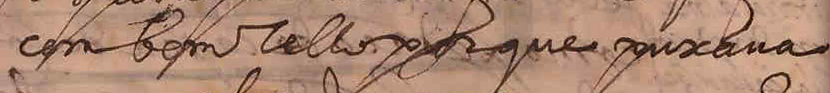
com bom zello porque puxaua
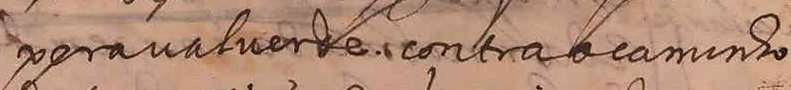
pera ualuerde contra o caminho
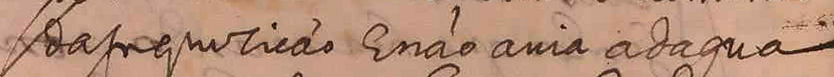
da Jnquiziçaõ E não auia adagua
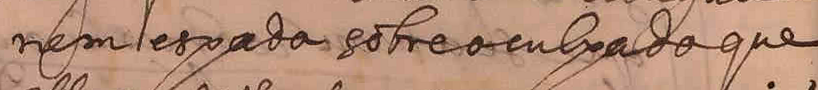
nem espada sobre o culpado que
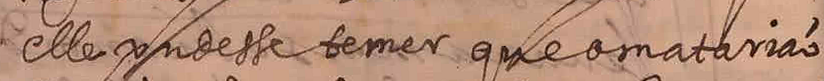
elle pudesse temer que o matariaõ
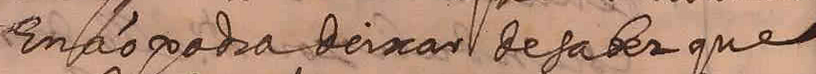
E naõ podia deixar de saber que
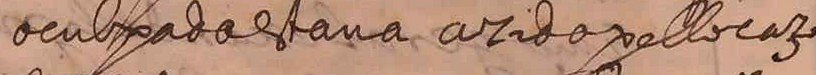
o culpado estaua azido pello cazo
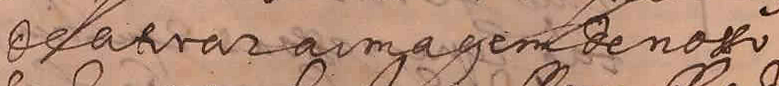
de atirar a imagem de nosso
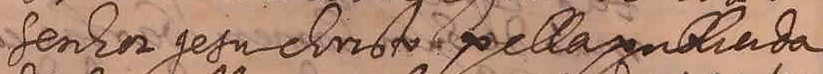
senhor Jesu christo pella publicida
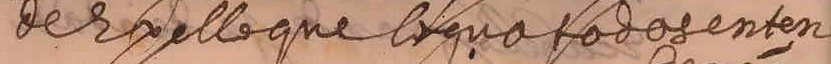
de E pello que loguo todos enten
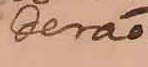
deraõ
